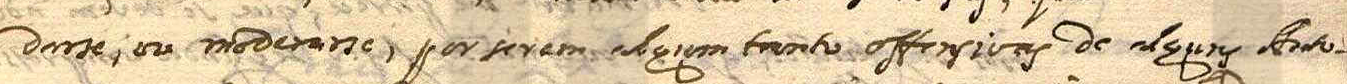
darse, ou moderarse, por serem algum tanto offensivas de alguns Auto
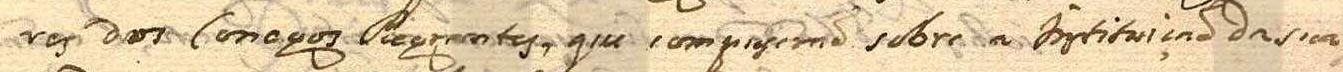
res dos Conegos Regrantes, que compuseraõ sobre a Instituiçaõ da sua
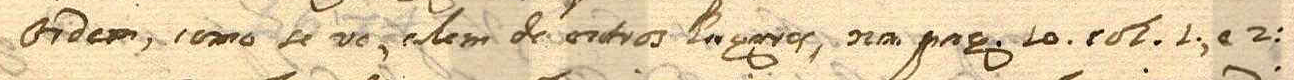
Ordem, como se ve, alem de outros lugares, na pag. 10. col. 1; e 2:
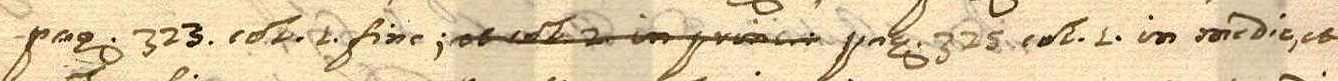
pag. 323. col. 1. fine; et col. 2 in princ.: pag. 325 col. 1. in medio, et
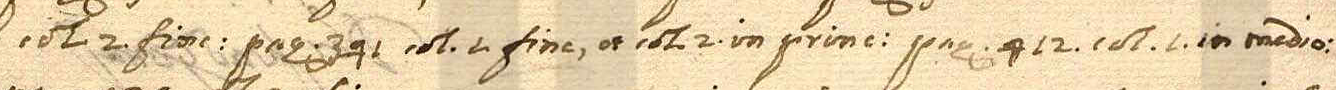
coL 2. fine: pag. 391 col. 1 fine, et col. 2. in princ: pag. 412. col. 1. in medio:
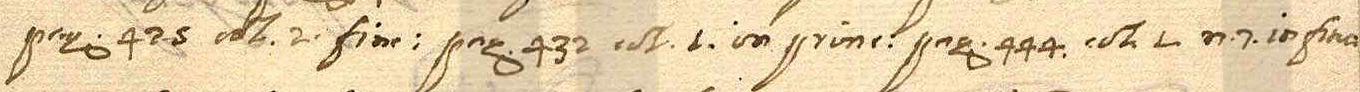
pag. 425 col. 2. fine: pag. 432 col. 1. in princ. pag. 444. col. 1 n. 7. in fine:
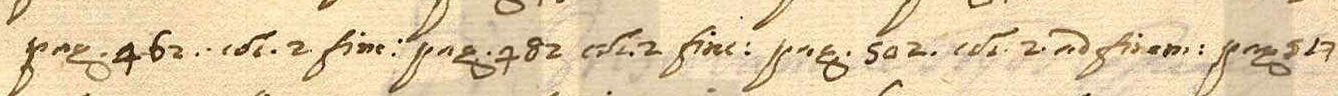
pag. 462. col. 2 fine: pag. 482 col. 2 fine: pag. 502. col. 2. ad finem: pag 517
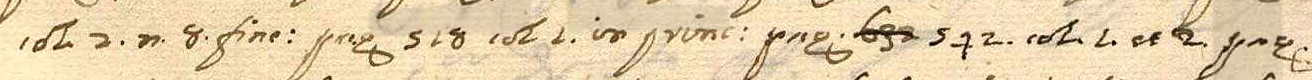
col 2. n. 8. fine: pag 518 col 1. in princ: pag. 638 542. col. 1 et 2. pag.
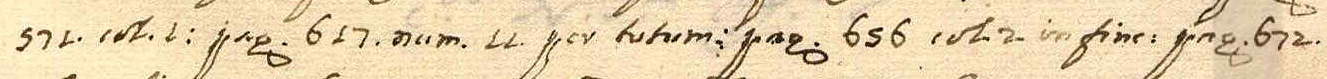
571. col. 1: pag. 617. num. 11. per totum: pag. 656 col 2. in fine: pag. 672.
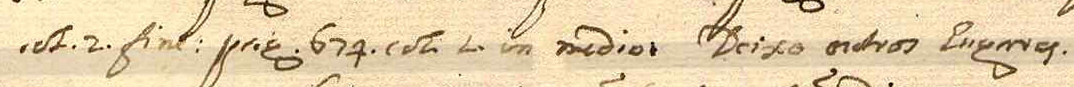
col. 2. fine: pag. 674. col 1. in medio: Deixo outros lugares.
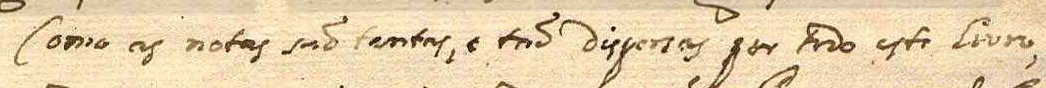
Como as notas saõ tantas, e taõ dispersas por todo este livro,
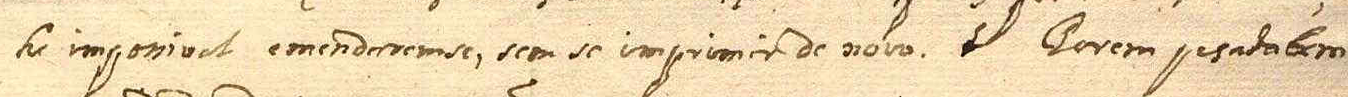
he impossivel emendaremse, sem se imprimir de novo. Porem pesada bem
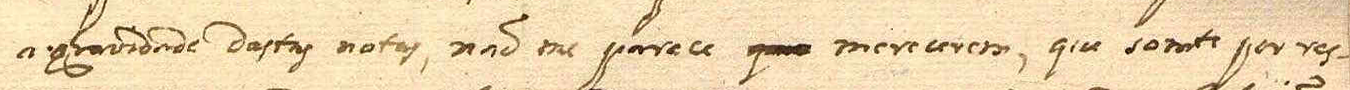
a gravidade destas notas, naõ me parece que merecerem, que somte por res
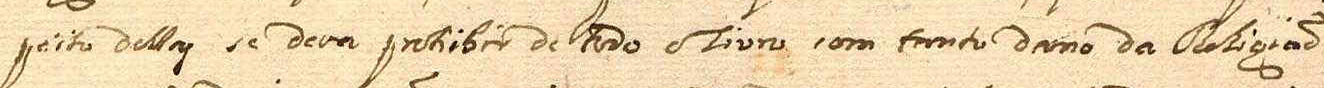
peito dellas se deva prohibir de todo o livro com tanto dano da Religiaõ
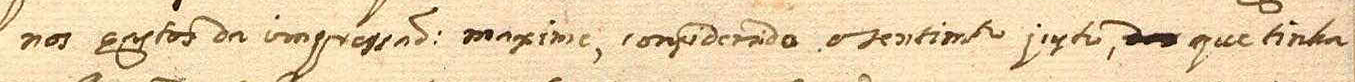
nos gastos da impressaõ: maxime, considerado o sentimto justo, dos que tinha
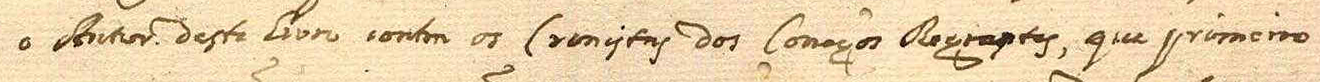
o Autor deste livro contra os Cronistas dos Conegos Regrantes, que primeiro
